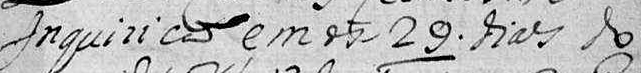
Jnquisicaõ em os 29. dias do
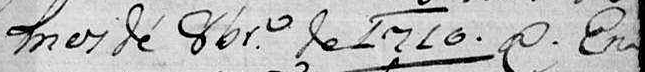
mes de 8br.o de 1710. ā E na
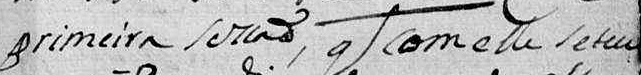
primeira sessaõ, q̄ com elle se teu
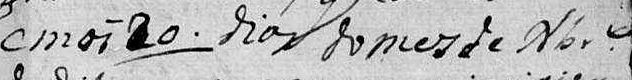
em os 20. dias do mes de Nbr.o
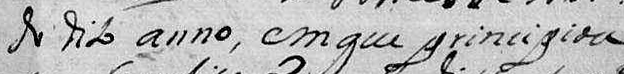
do dito anno, em que principiou
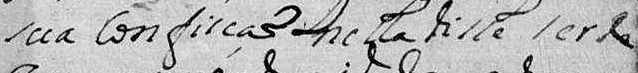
sua confisçaõ nella disse ser de
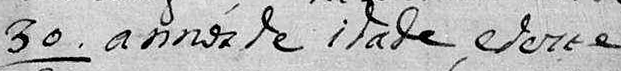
30. annos de idade, e deste
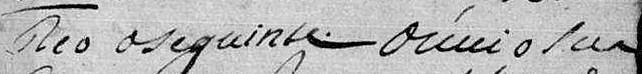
Reo o seguinte. ouuio sua
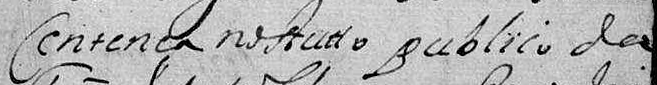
Centença no Autto publico da
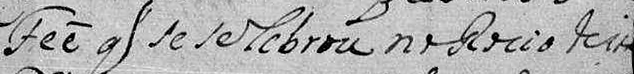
Feé q̄ se selebrou no Rocio dest
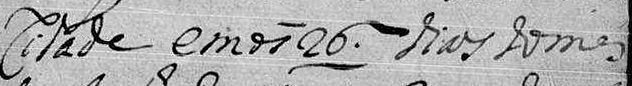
Cidade em os 26. dias do mes
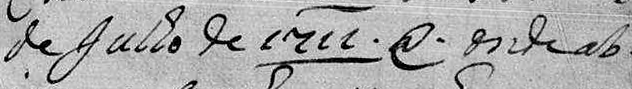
de Julho de 1711. ā. onde ab
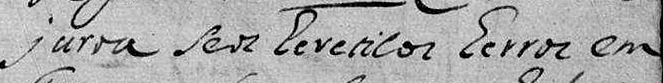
jurou seos hereticos herros em
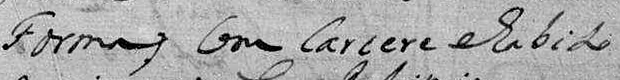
Forma, com carcere e habito
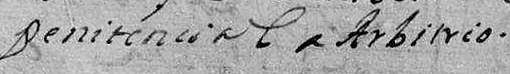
penitencial a Arbitrio.
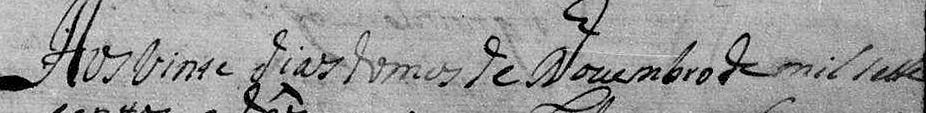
Aos vinte dias do mes de Nouembro de mil sette
